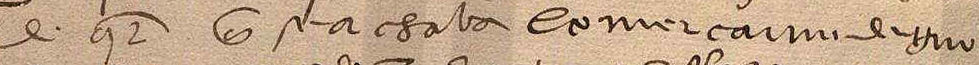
de q̄r q̄ se achava e comer carne deguo
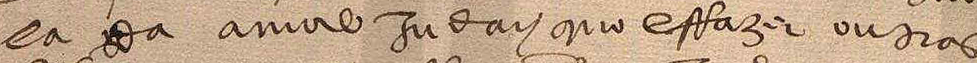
lada a modo Judayquo e ffazer outras
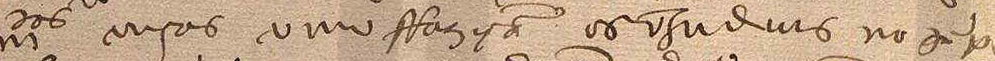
mtas cousas como ffazyā os oJudeus no tēpo
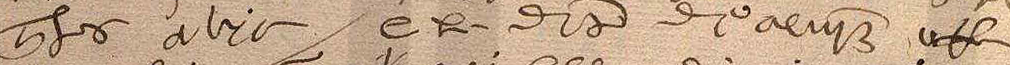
q̄ hos avya / e ele djto djo alur̄z o Re
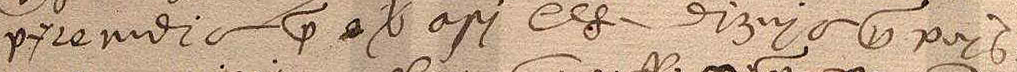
premdja p̄o o ꝟ asy e lhe djzya q̄ poys
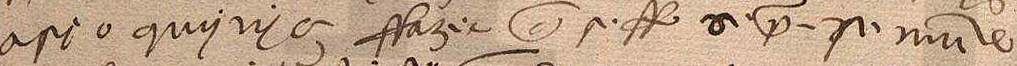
asy o quyrya ffazer q̄ se ffose p̄o ese mūdo
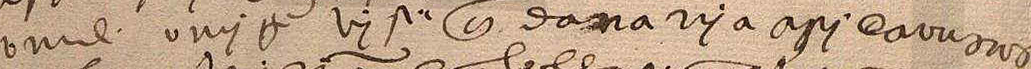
omde o nygē vyse q̄ danarya a sy e a outros
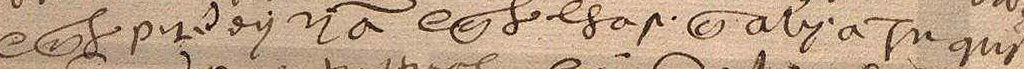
e q̄ ho preēdyrjā e q̄ holhase q̄ avya a Jnquj
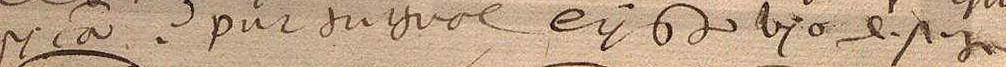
syçā ē purtugual e ysto vyo de sete
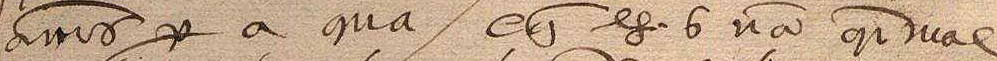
an̄os ꝑa qua / e q̄ lhes não q̄r mal
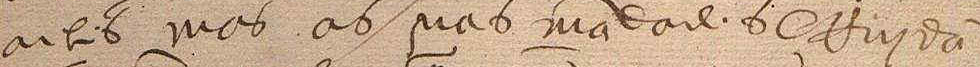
a eles mas as suas mādades e Ruydā
